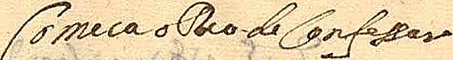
Comeca o Reo de Confessar
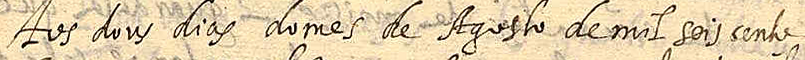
Aos dous dias do mes de Agosto de mil seiscentos
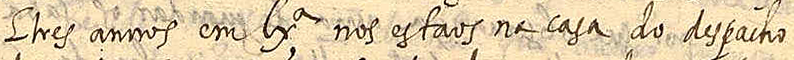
E tres annos em lxa nos estaos na casa do despacho
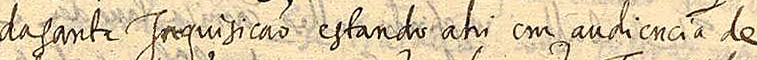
da santa Jnquisicaõ estando ahi em audiencia de
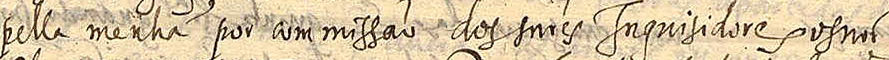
pella menhā por commissaõ dos snrēs Jnquisidores o snor̄
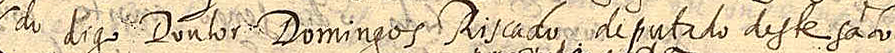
Ldo digo Doutor Domingos Riscado deputado deste sāto
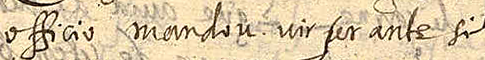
officio mandou uir perante si
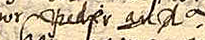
por pedir auda.
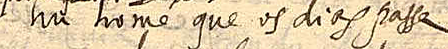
hū homē que os dias passa
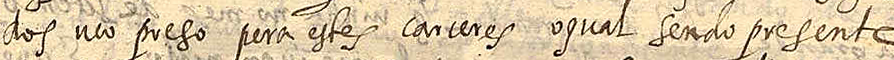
dos ueo preso pera estes carceres o qual sendo presente
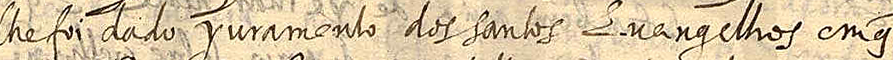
lhe foi dado yuramento dos santos Euangelhos em q̄
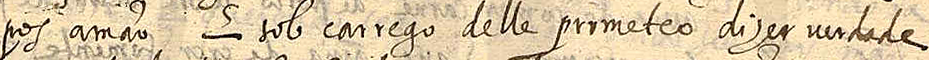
pos a mão E sob carrego delle prometeo dizer uerdade
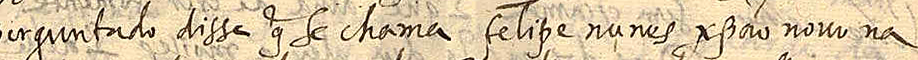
perguntado disse q̄ se chama felipe nunes xpão nouo na
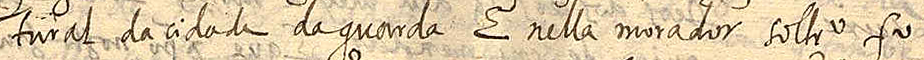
tural da cidade da guarda E nella morador soltro fo
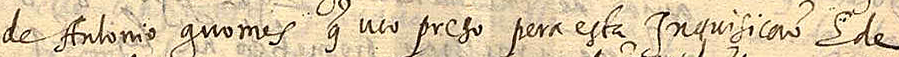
de Antonio guomes q̄ ueo preso pera esta Jnquisicaõ E de
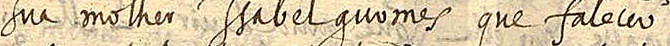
sua molher Jsabel guomes que faleceo
